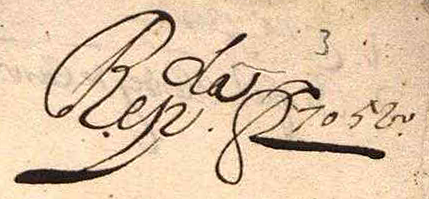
Rep.da fl70520
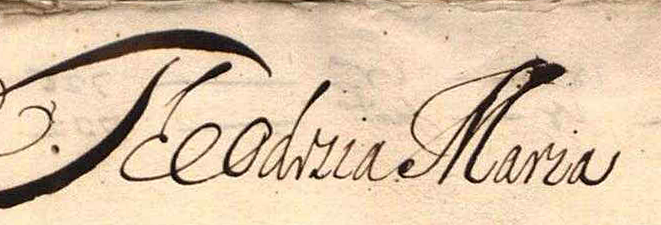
Theodizia Maria
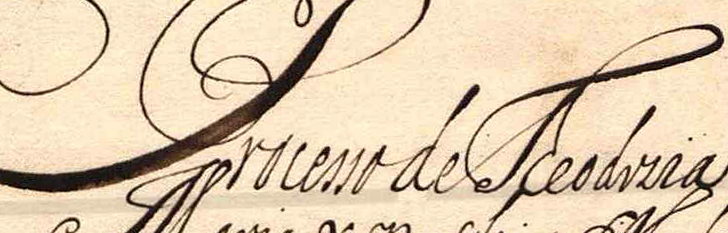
processo de Theodizia
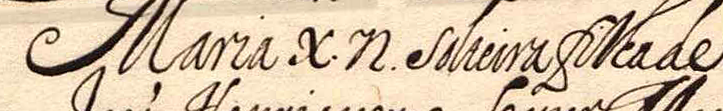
Maria x. n. solteira filha de
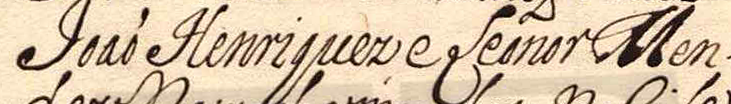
Ioaõ Henriquez, e Leonor Men
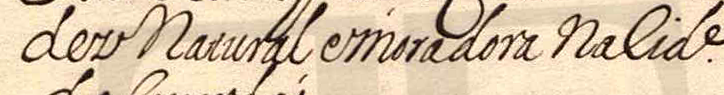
dez Natural, e moradora na Cid.e
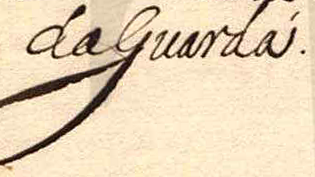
da Guarda.
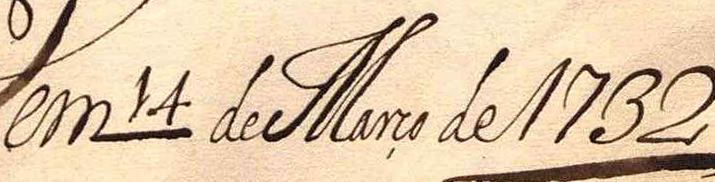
em 14 de Março de 1732
